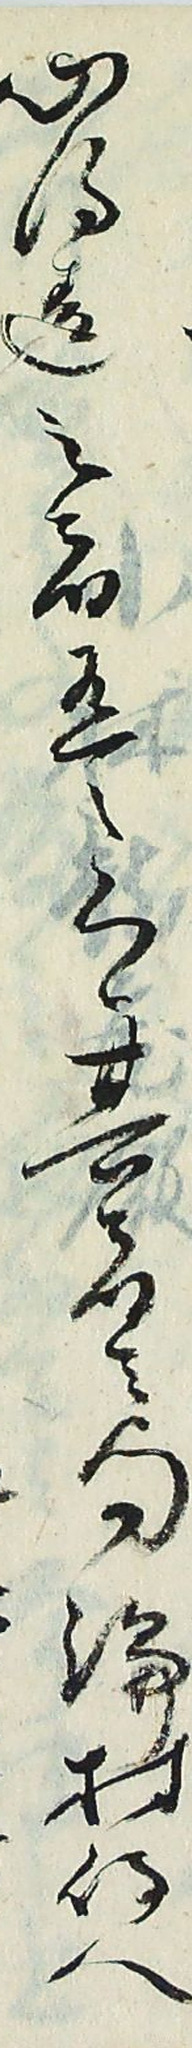心得違之者有之候はゝ其者は勿論村役人
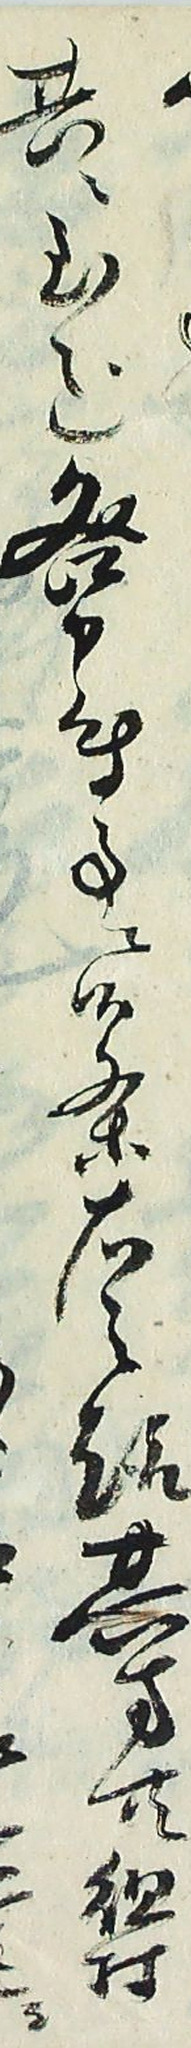共に至迄咎申付事に候条右之趣其方供共組村
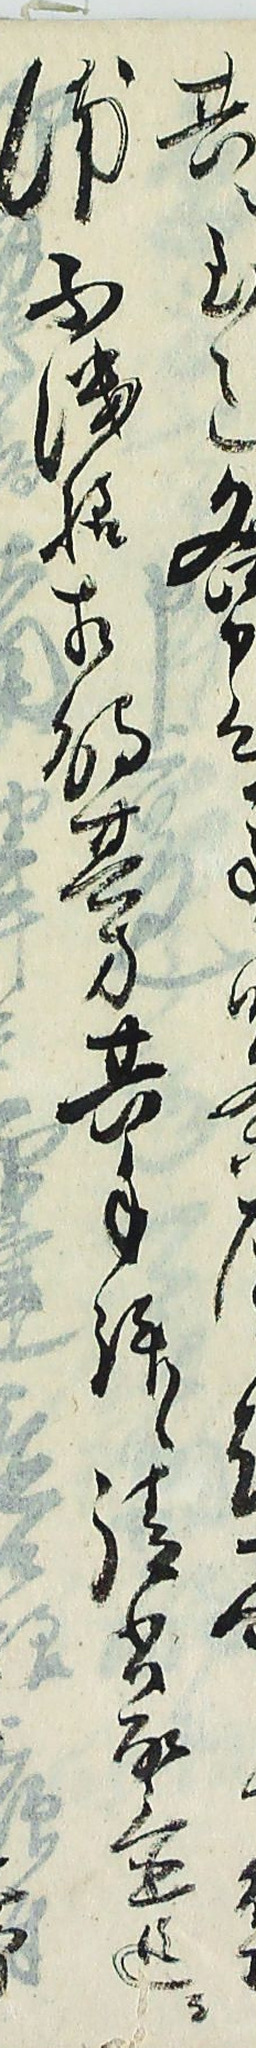浦不洩様相触其方共手許へ請書取置追而
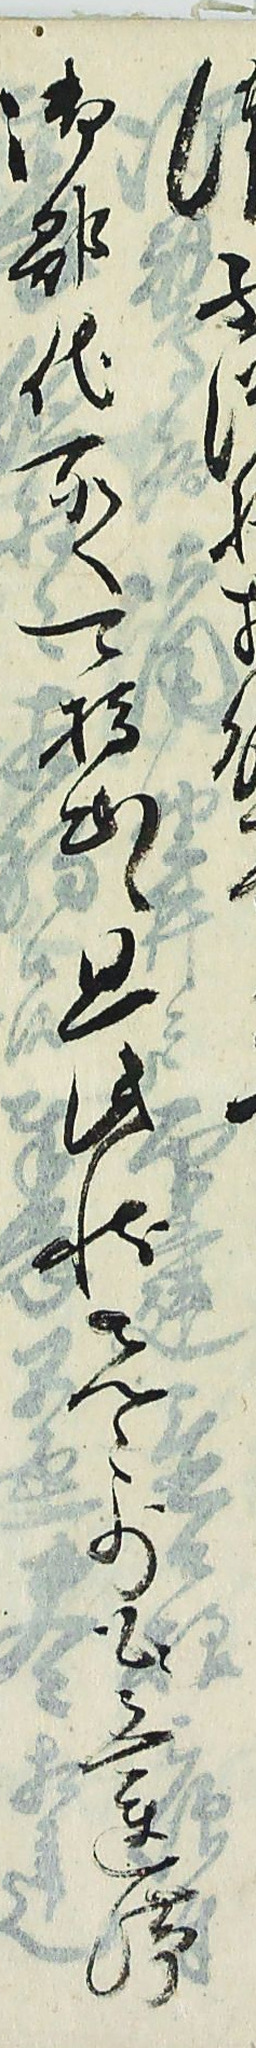御郡代所へ可指出候且此状先々少も無遅滞
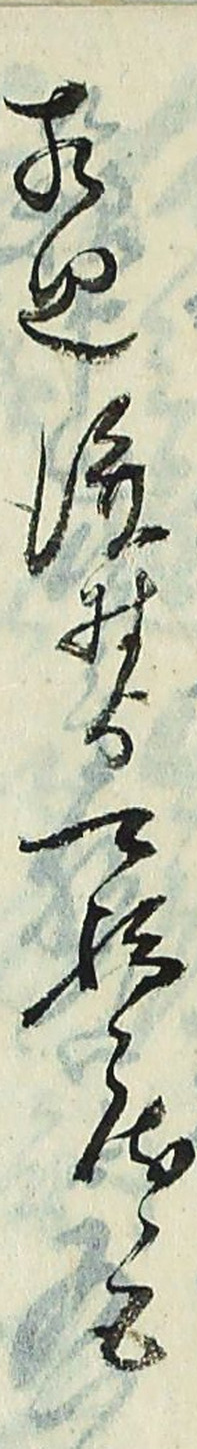相廻済村ゟ可指戻候以上
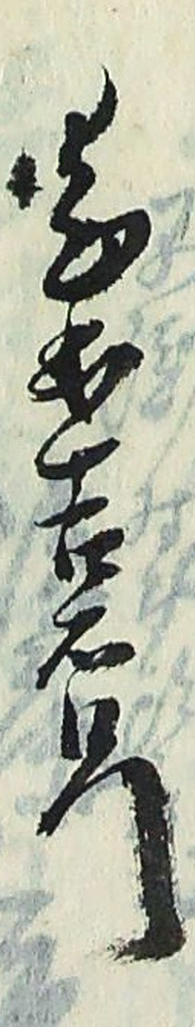岡本吉右衛門
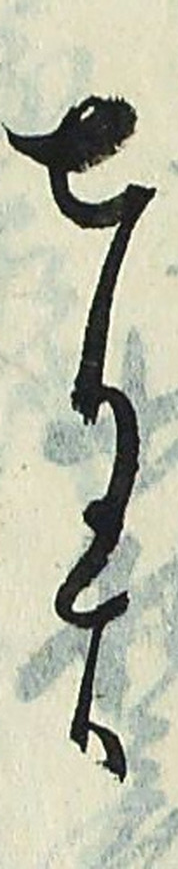七月十日
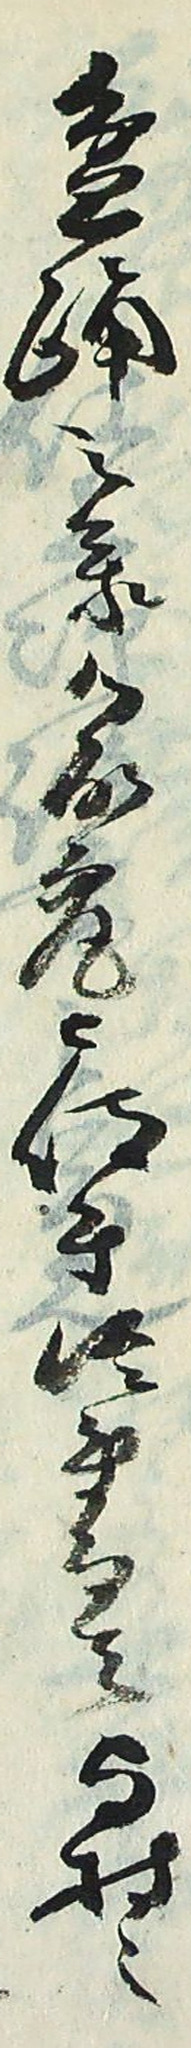盆踊之義御取究被仰付候に付而は与村々
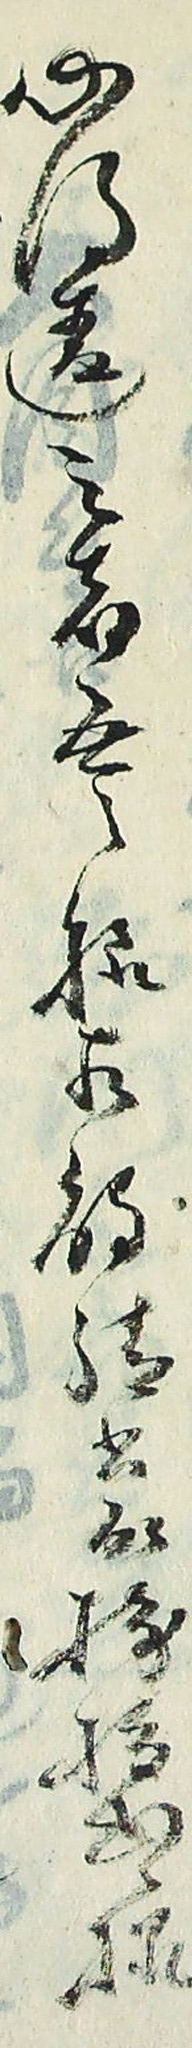心得違之者無之様相触請書取揃指出候様
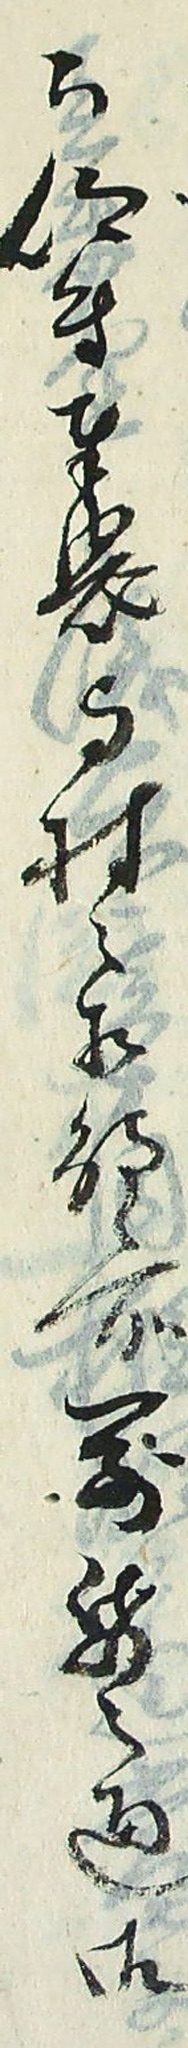被仰付奉畏与村々相触候所別帋之通御

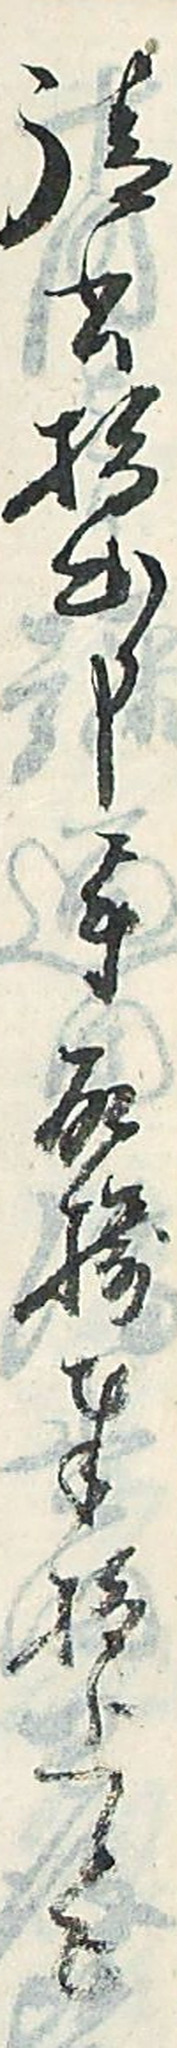請書指出申に付取揃奉指上候以上
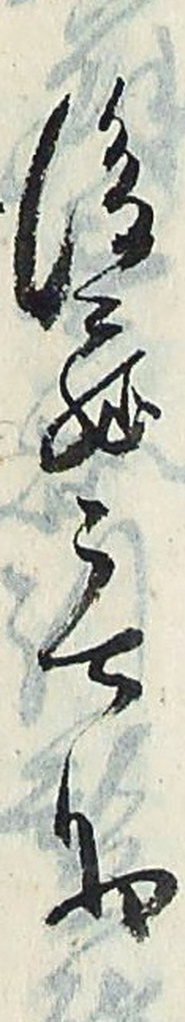後藤庄助
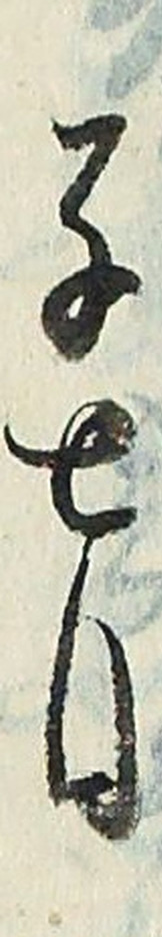子七月
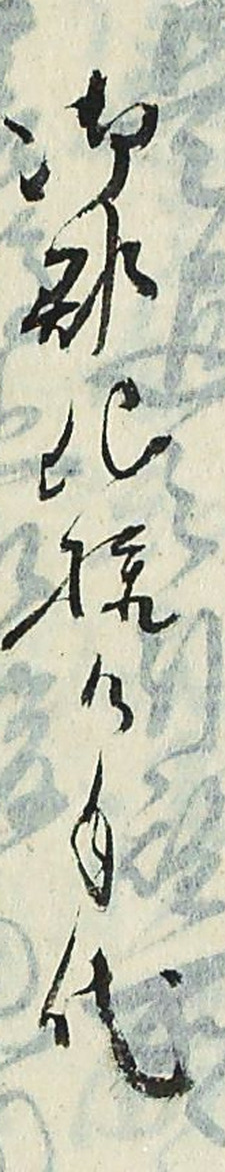御郡代様御手代
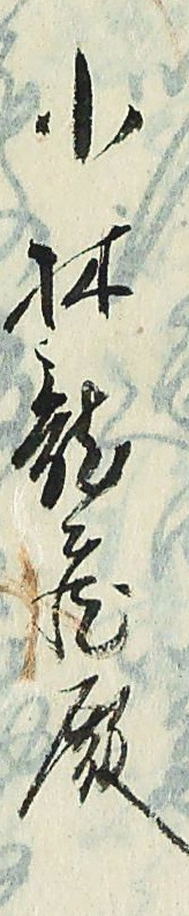小林龍蔵殿
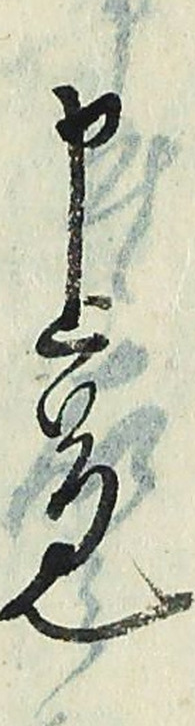申上覚
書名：諸御用御□受書控
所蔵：鳴門教育大学 Naruto University of Education
